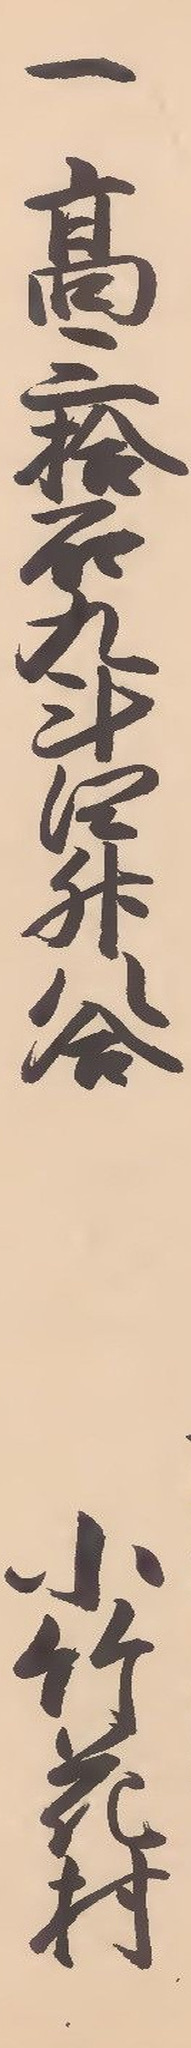一高三拾石九斗四升八合小竹花村
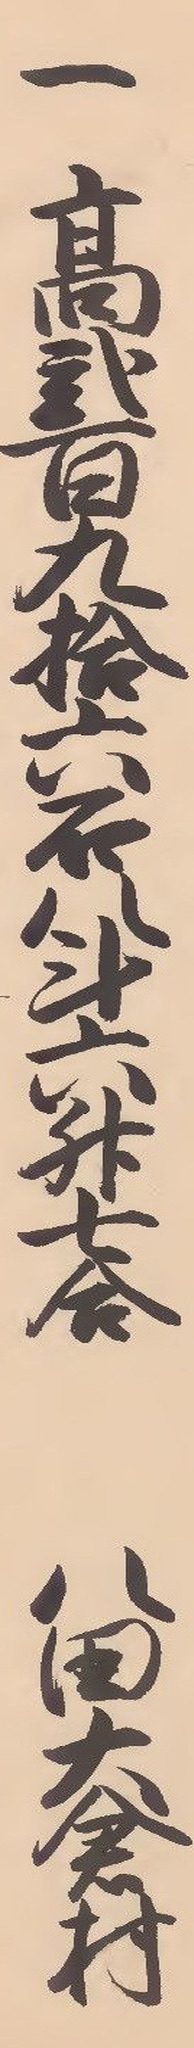一高弐百九拾六石八斗六升七合八田大倉村
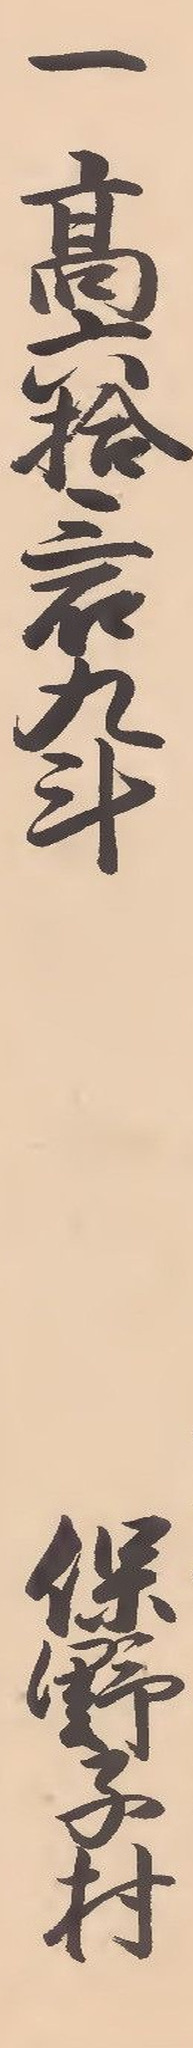一高六拾三石九斗保野子村
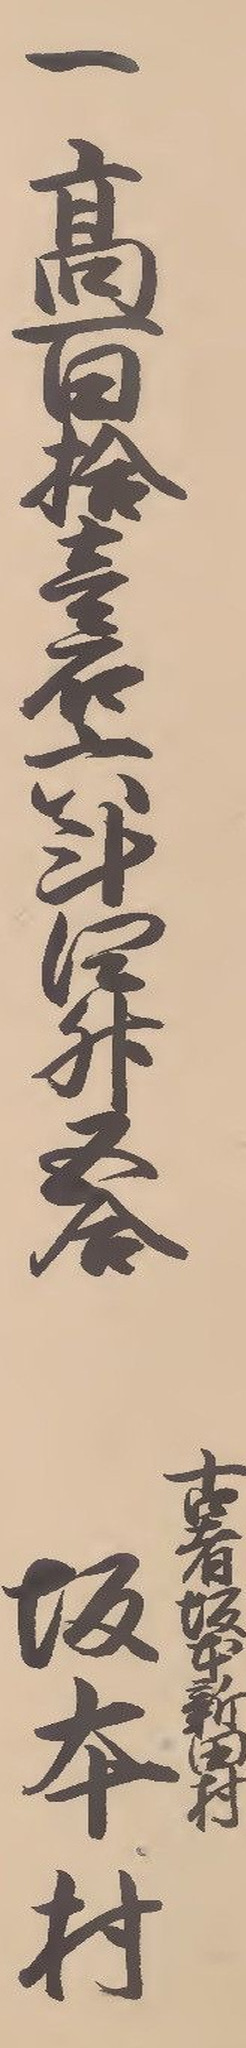一高百拾壱石六斗四升五合坂本村
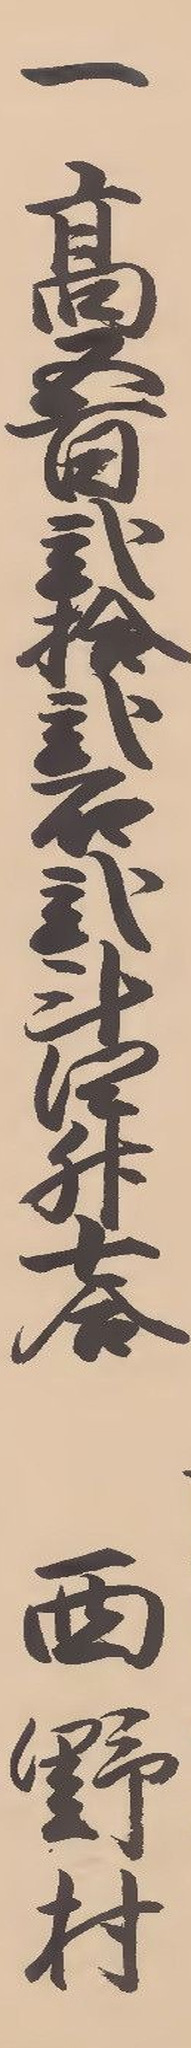一高五百弐拾弐石弐斗四升七合西野村
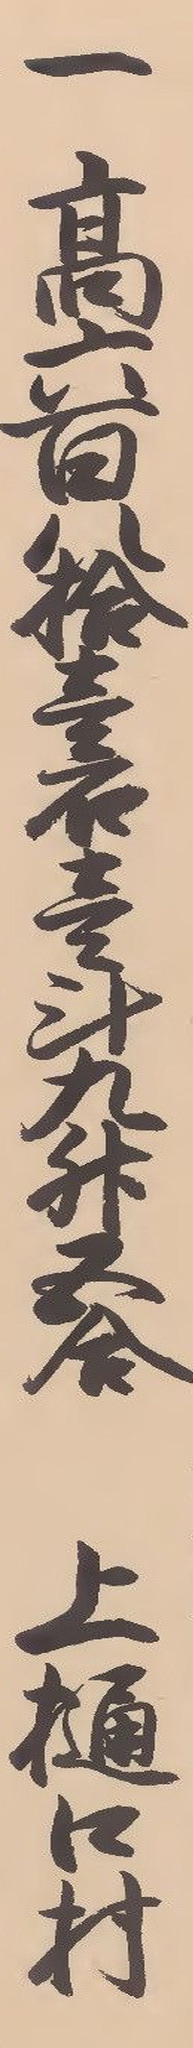一高六百八拾壱石壱斗九升五合上樋口村
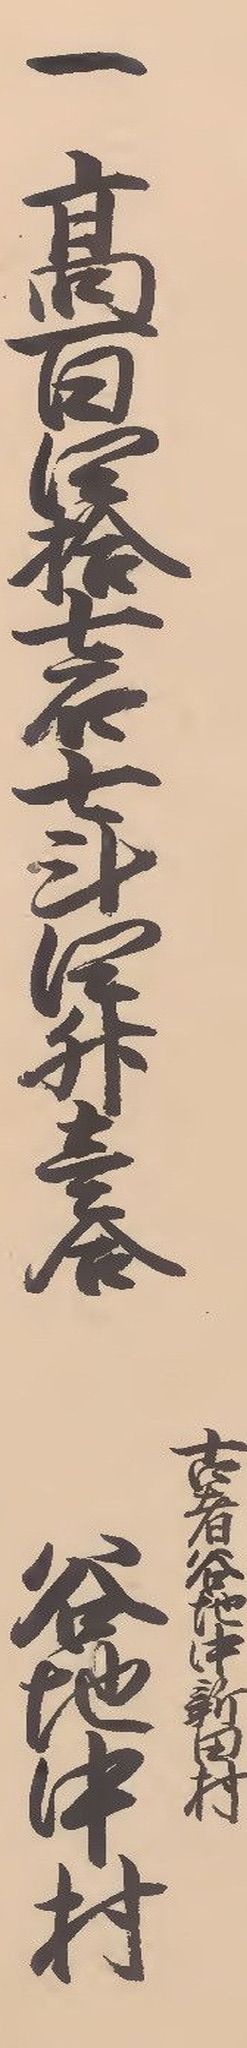一高百四拾七石七斗四升壱合谷地中村

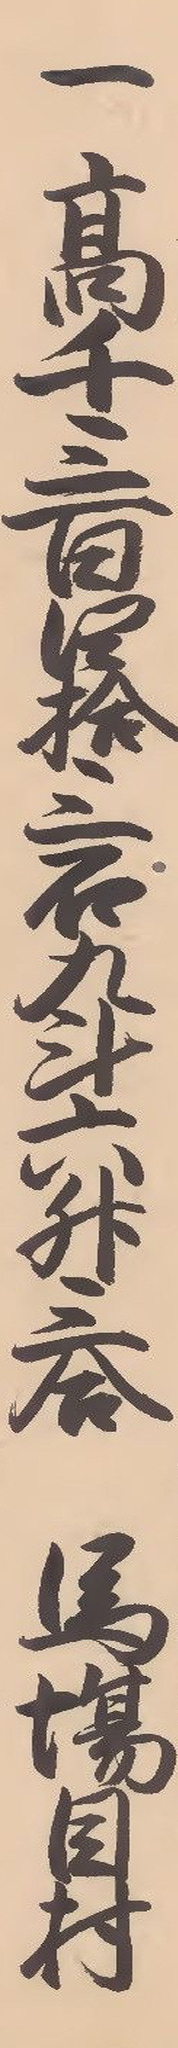一高千三百四拾三石九斗六升三合馬場目村
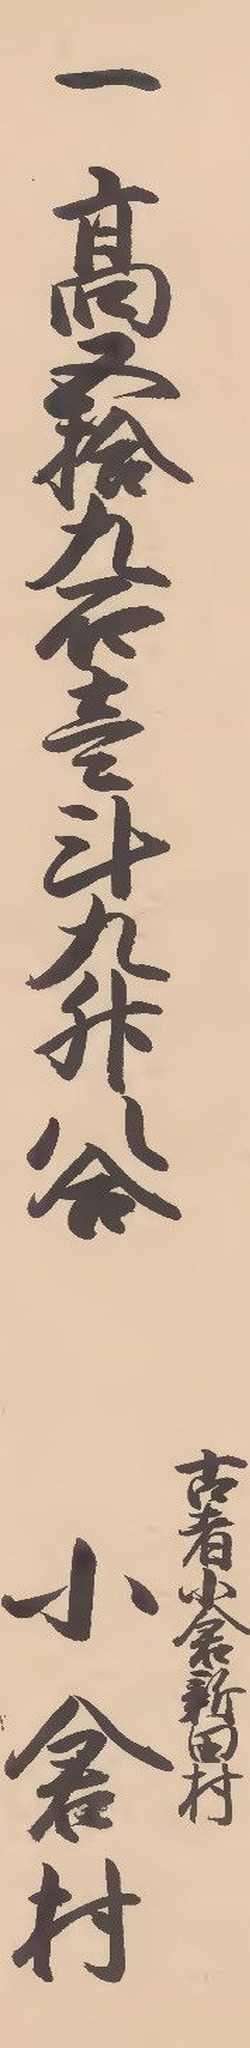一高五拾九石壱斗九升八合小倉村
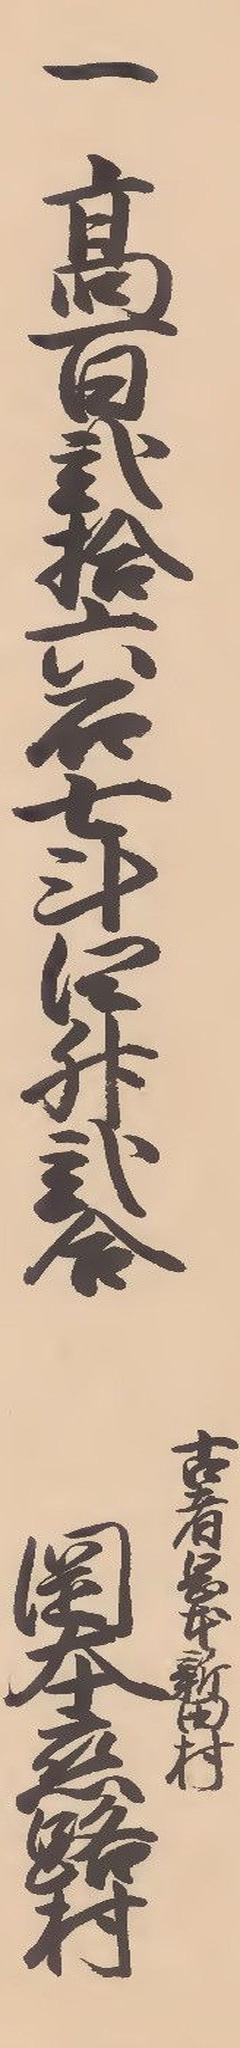一高百弐拾六石七斗四升弐合岡本恋路村
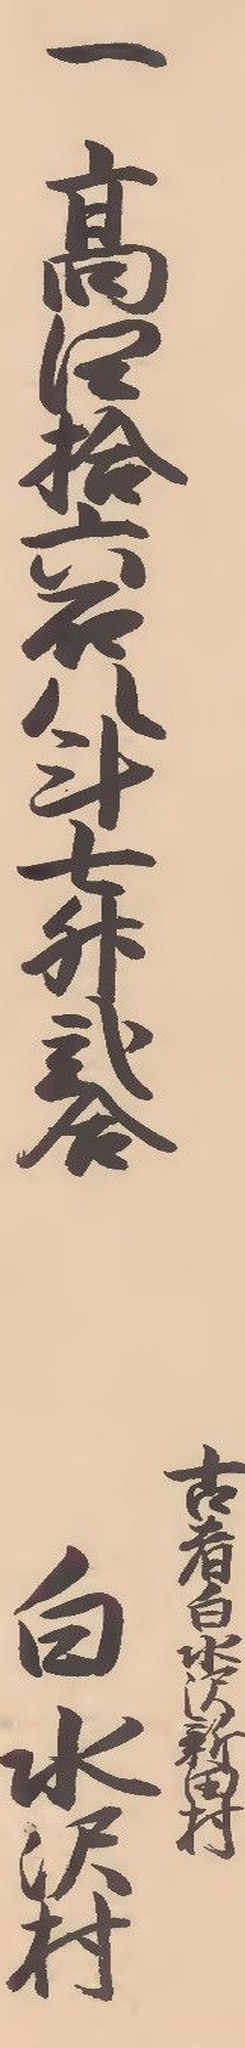一高四拾六石八斗七升弐合白水沢村
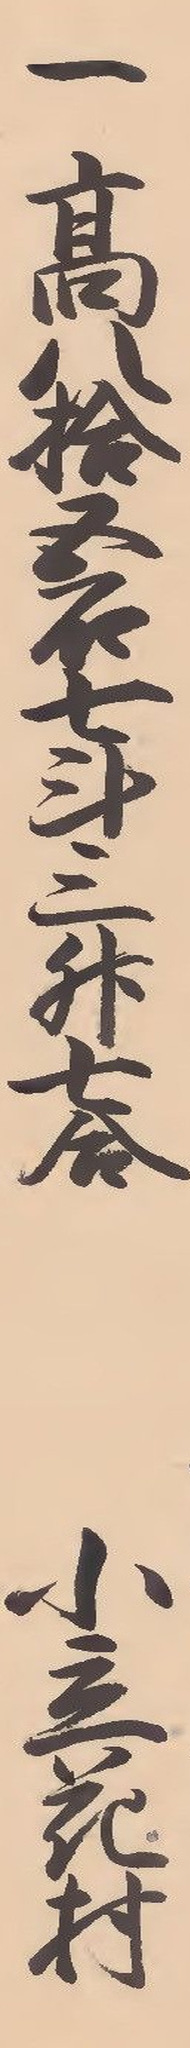一高八拾五石七斗三升七合小立花村
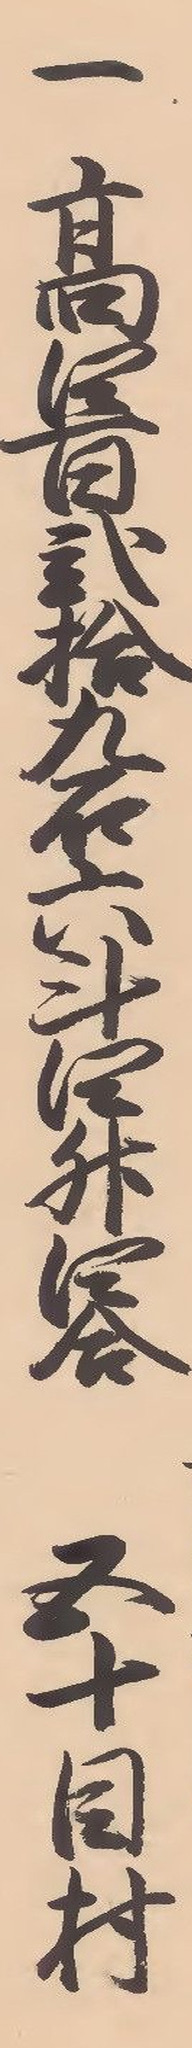一高四百弐拾九石六斗四升四合五十目村
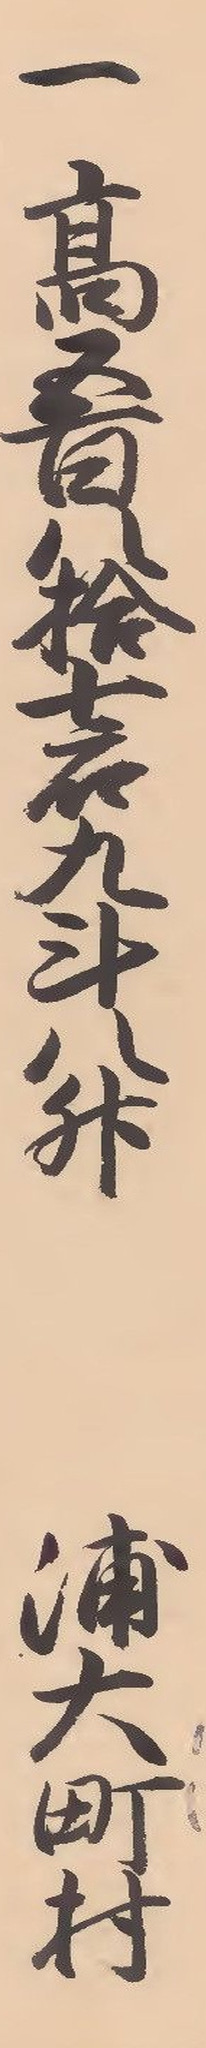一高五百八拾七石九斗八升浦大町村
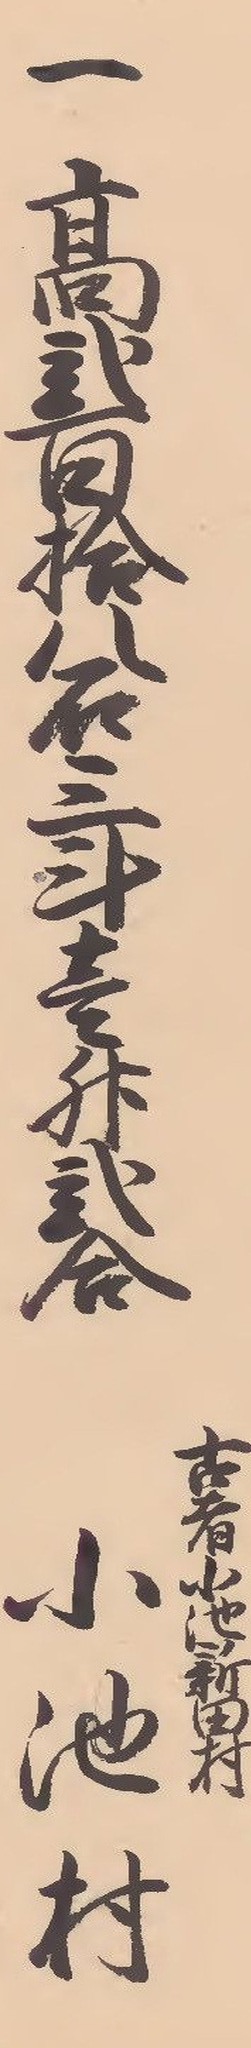一高弐百拾八石三斗壱升弐合小池村

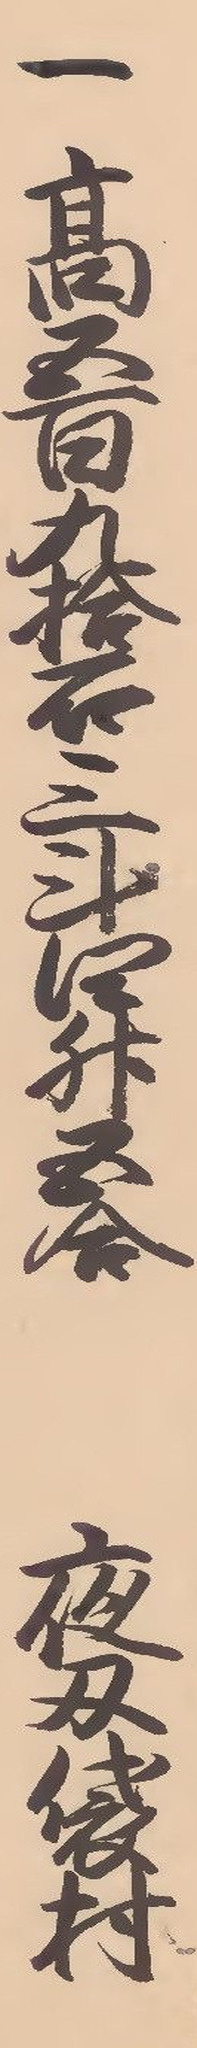一高五百九拾石三斗四升五合夜叉袋村
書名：出羽国郷帳　５
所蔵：国立公文書館 National Archives of Japan
